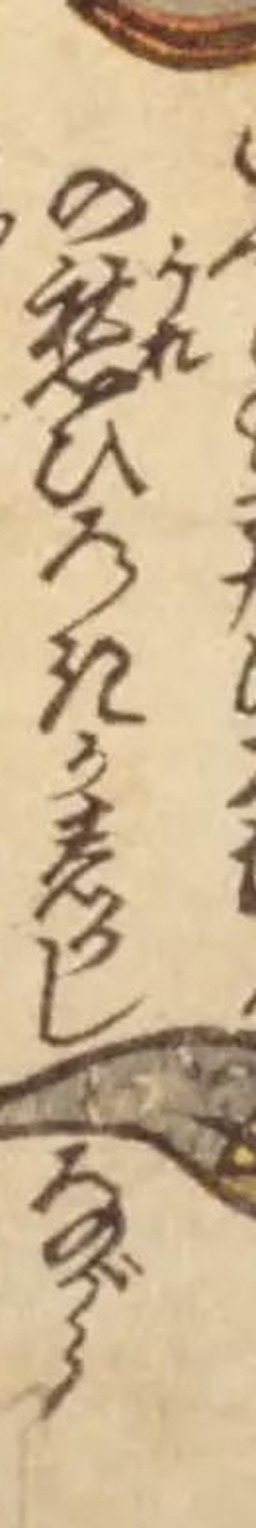の愁ひなきかしかしながら
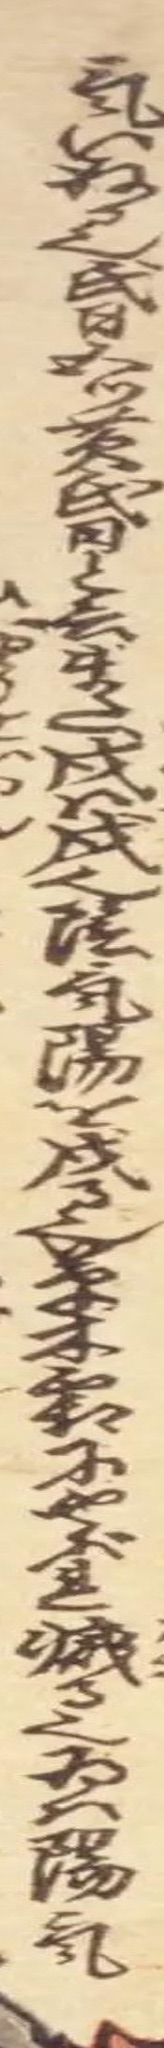気いぬる也昏五ツ黄昏と云また戌は戌也陰気陽を戌る也草木霜にやぶれ滅る也ゐは陽気
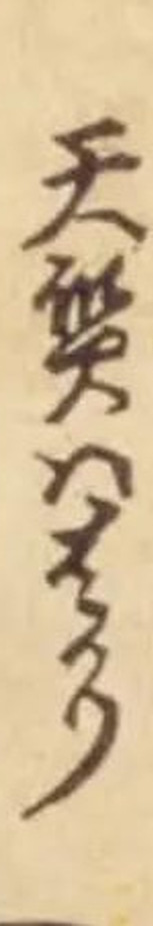天質ははかり
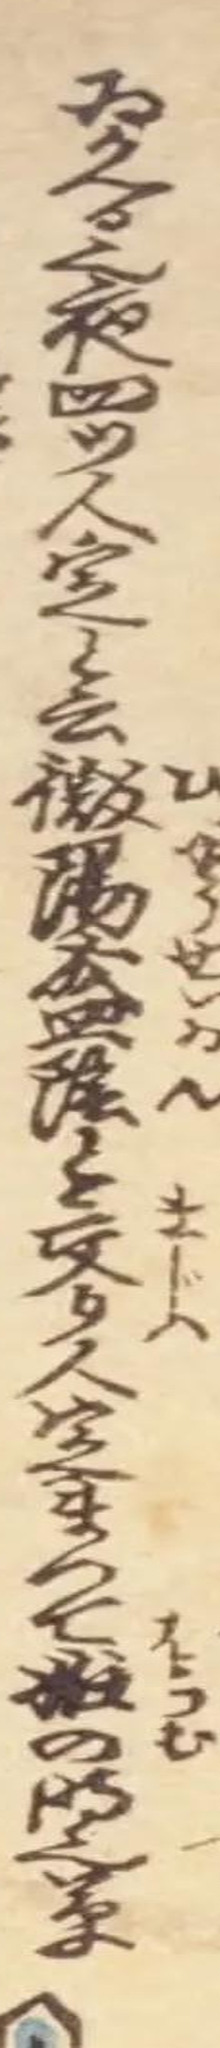ゐかへる也夜四ツ人定と云微陽盛陰と交り人定まつて妊の時也草
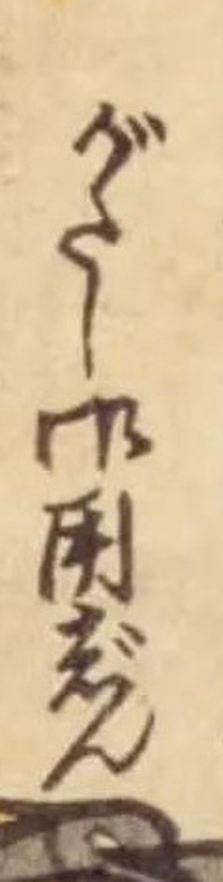がたし御用じん
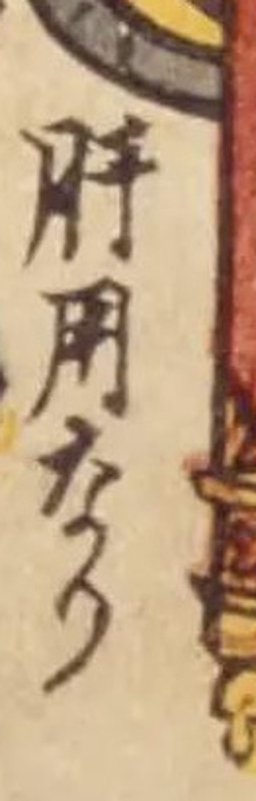肝用なり
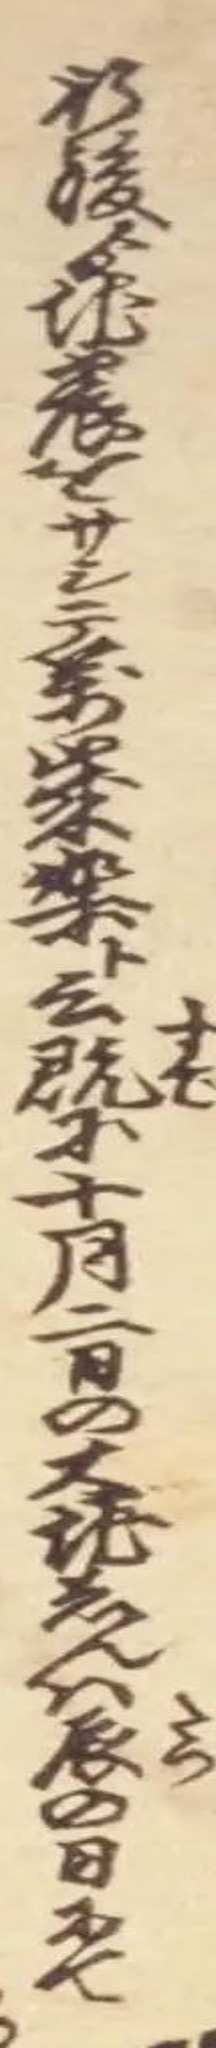祈ゟ地震をサシテ万歳楽ト云既に十月二日の大地しんは辰の日にて
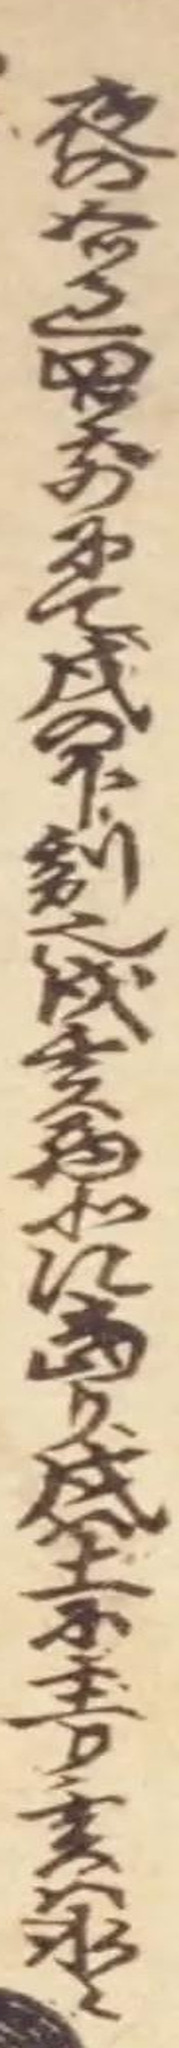夜の五ツ過四ツ前にて戌の下刻也戌亥西北に当り戌は土に主り亥は水ニ
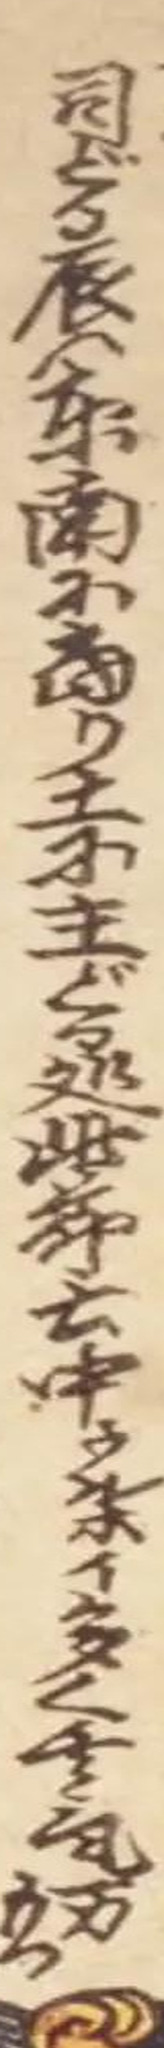司どる辰は東南に当り土に主どる処此節云中ウルホイ多く其気万もつ
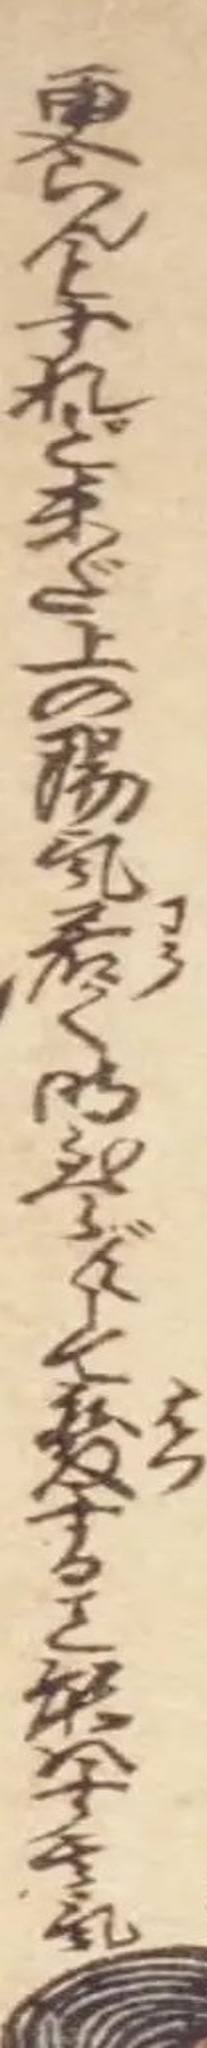更らんとすれど未だ上の陽気若く時至らずして発すること能はず其気
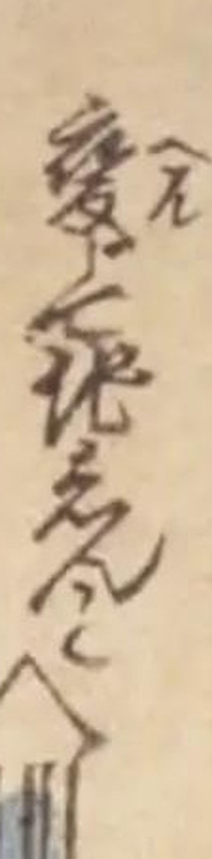変じて地しんと
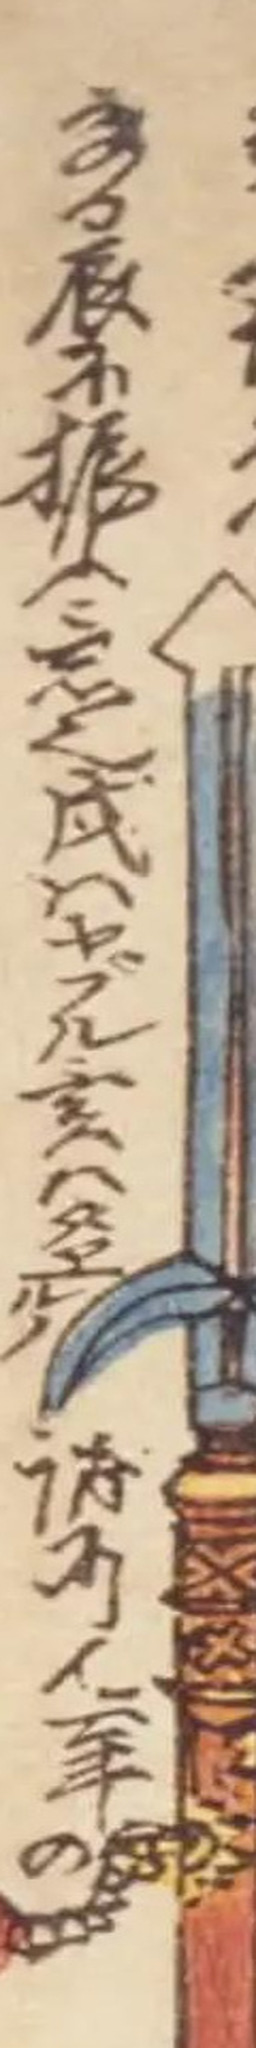なる辰に振ふ意也戌はヤブル亥はタヘルノにして一年の
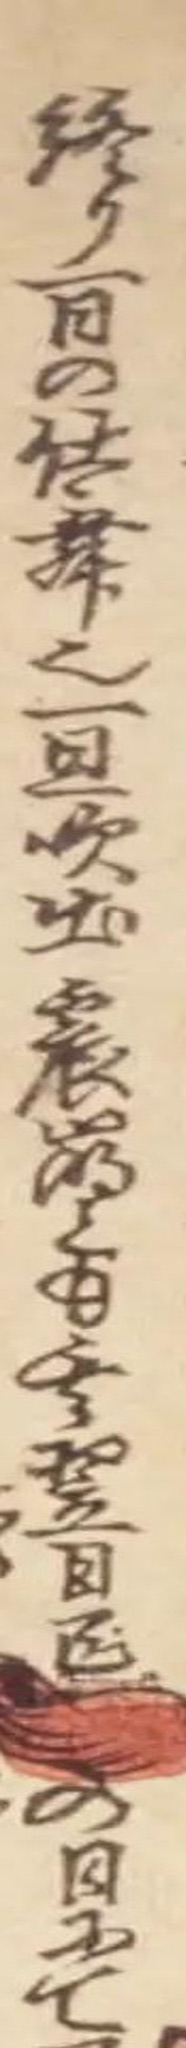終り一日の仕舞也一旦吹出震崩とも其翌日巳の日にて巳は
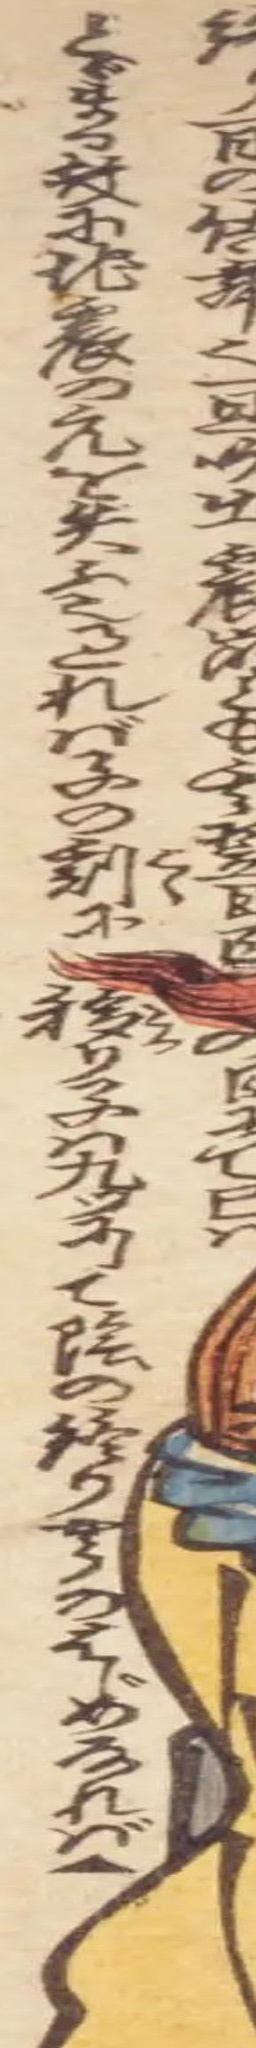とゞまる故に地震の元を失ふ也過れば子の刻に移り子は九ツにして陰の終りやうのはじめなれば▲
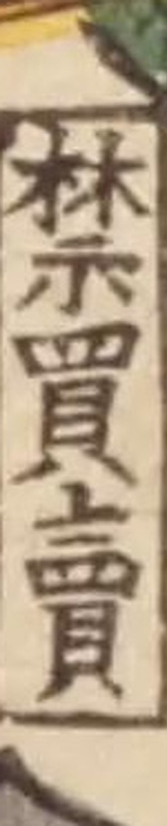禁買売
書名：地震吉凶之弁
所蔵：国立国会図書館 National Diet Library, JAPAN
